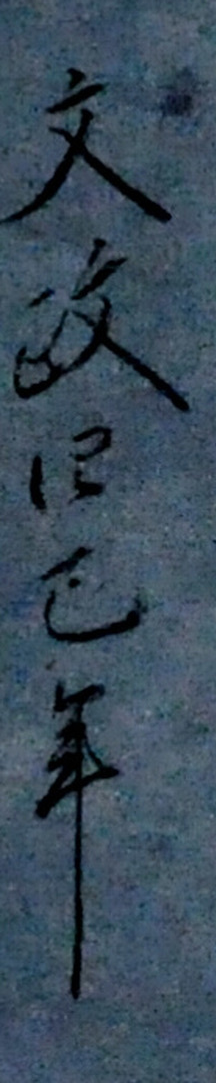文政四巳年
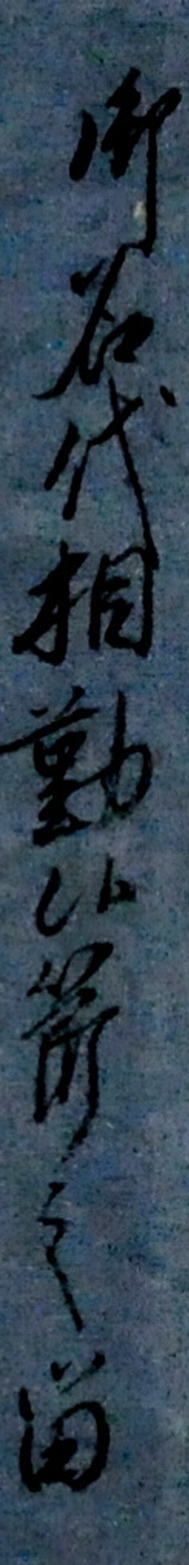御名代相勤候節之留
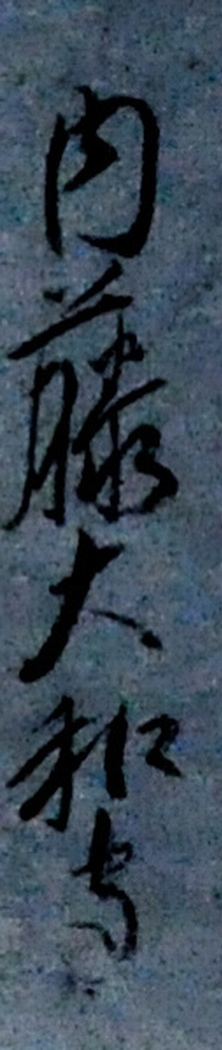内藤大和守

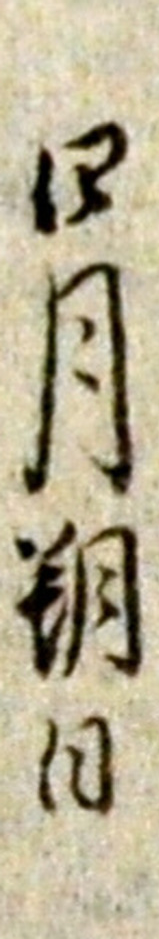四月朔日
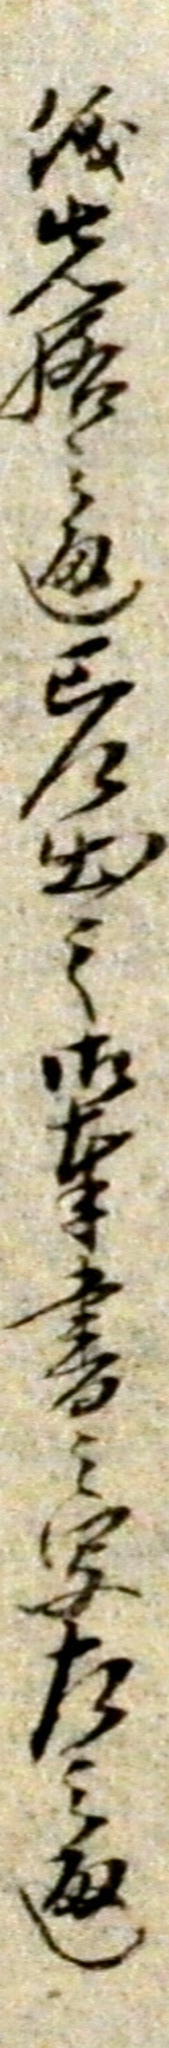先格之通差出之御奉書之写左之通
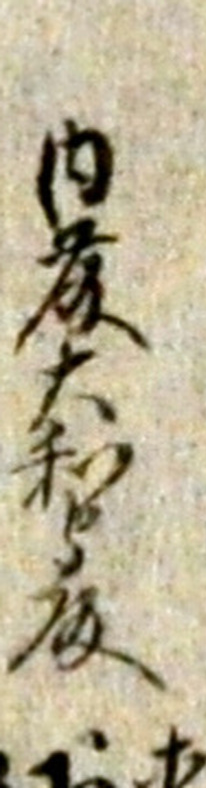|内藤大和守殿
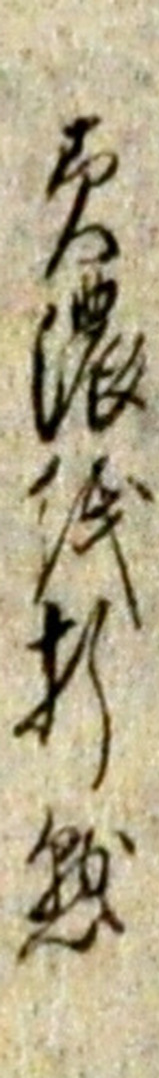美濃紙折懸
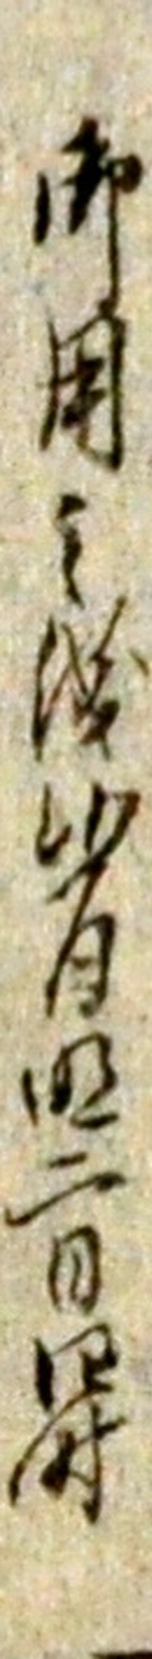御用之儀候ニ付明二日四時
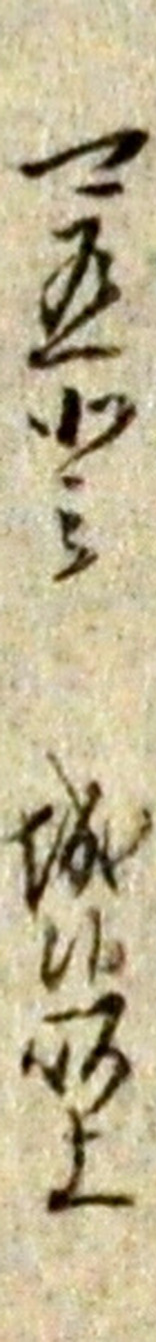|可有登城候以上
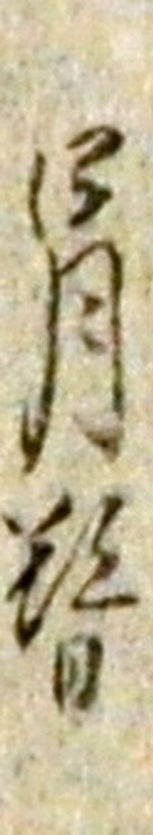四月朔日
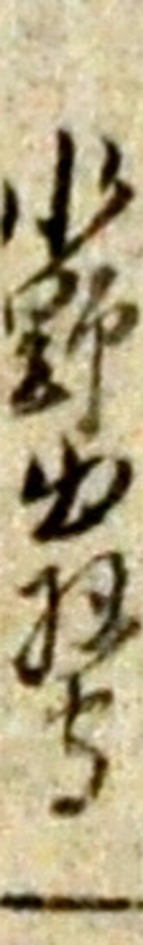|水野出羽守|
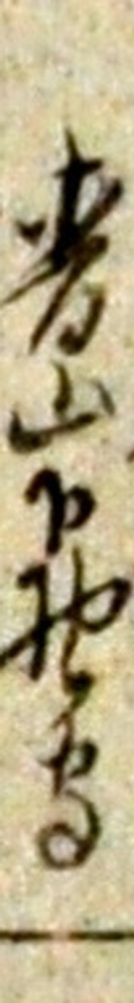|青山下野守
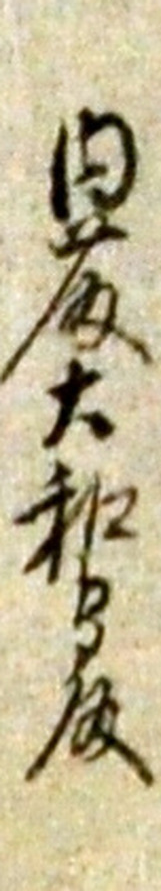|内藤大和守殿
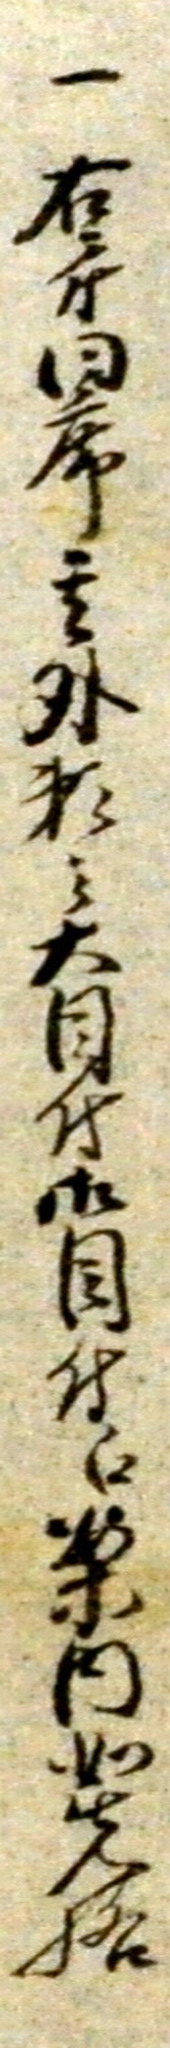一右二付同席其外頼之大目付御目付江案内如先格
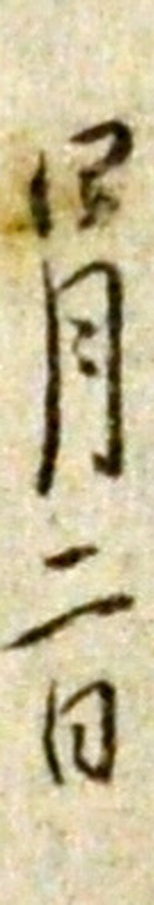四月二日
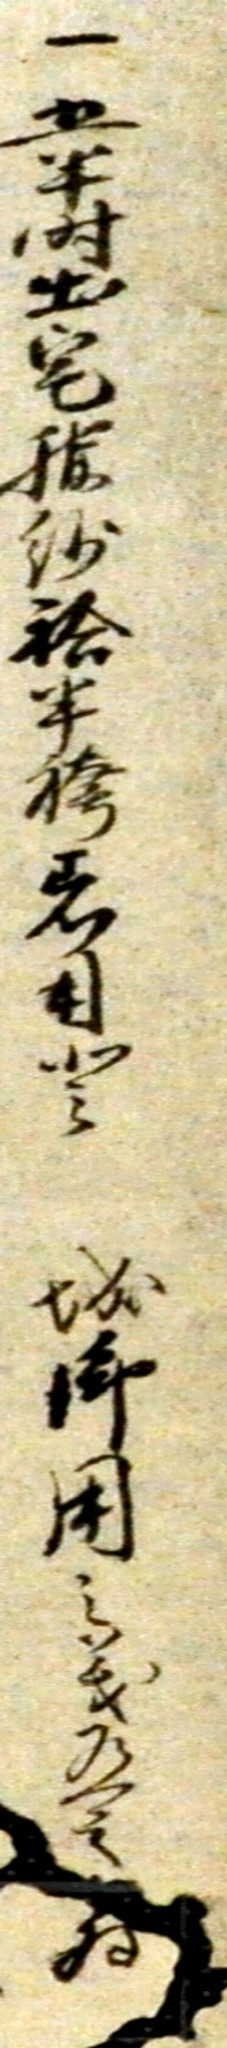一五半時出宅服紗袷半袴着用登城御用之有之候ニ付
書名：日光御名代相勤候節ノ留
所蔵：伊那市立高遠町図書館・合同会社AMANE
